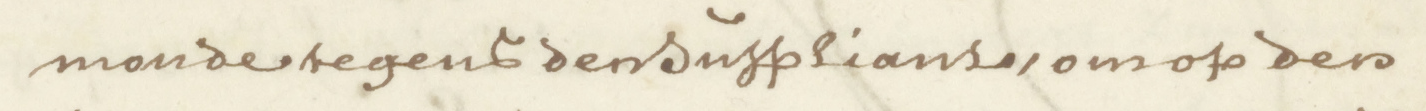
monde tegens den suppliant, om op den
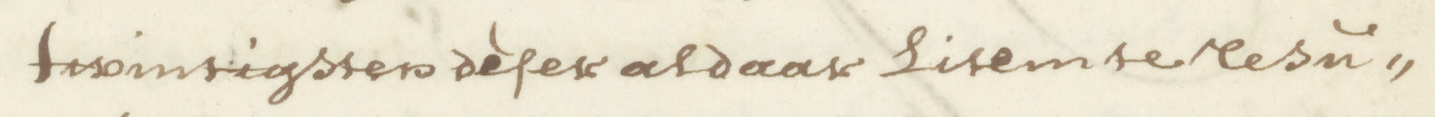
twintigsten deser aldaar litem te resu„
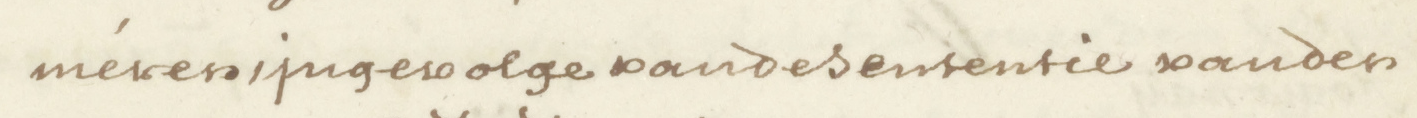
meren, ingevolge van de sententie vanden
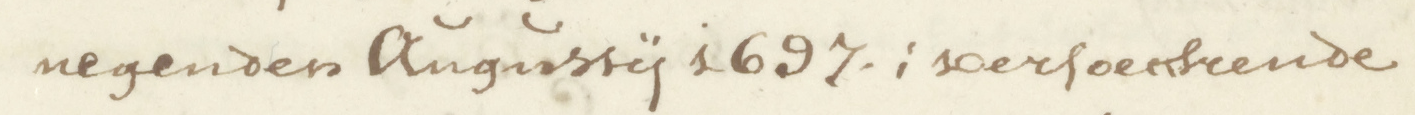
negenden Augustij 1697. versoeckende
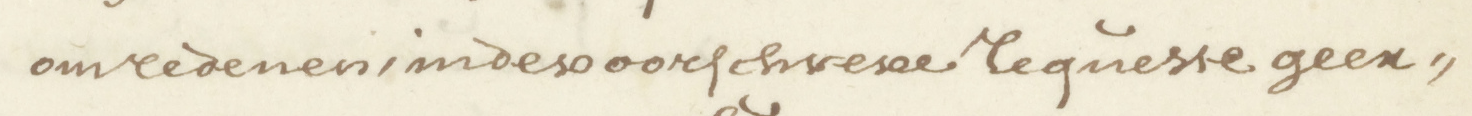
om redenen, inde voorschreve requeste geex„
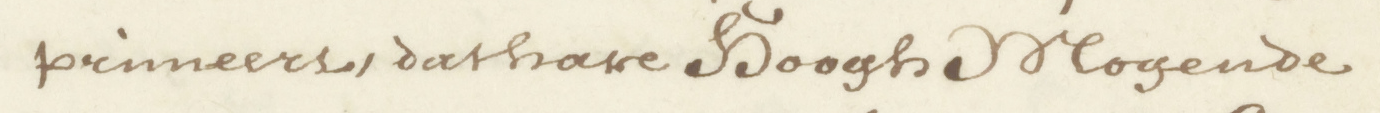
primeert, dat hare Hoogh Mogende
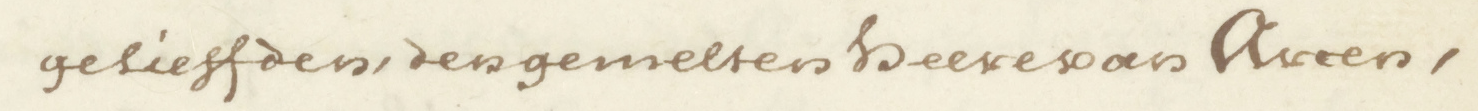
gelieffden, den gemelten heere van Arcen,
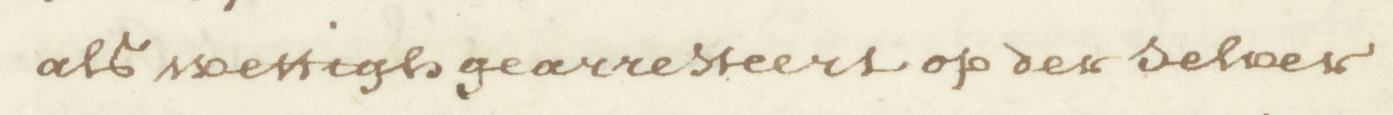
als wettigh gearresteert op der selver
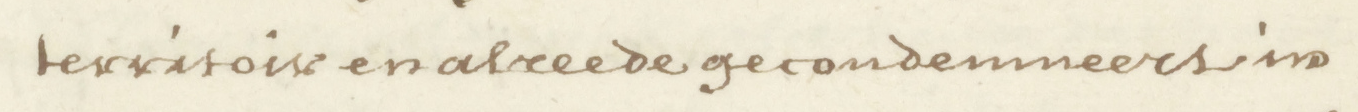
territoir en alreede gecondemneert in
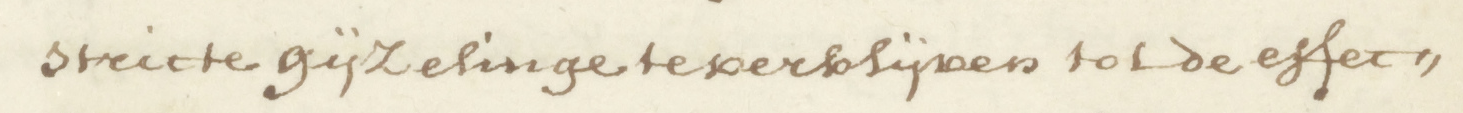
stricte gijzelinge te verblijven tot de effec„
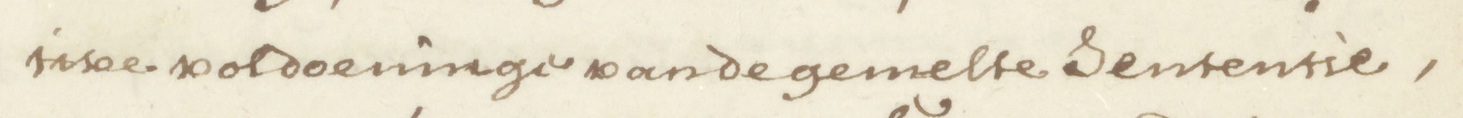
tive voldoeninge van de gemelte sententie,
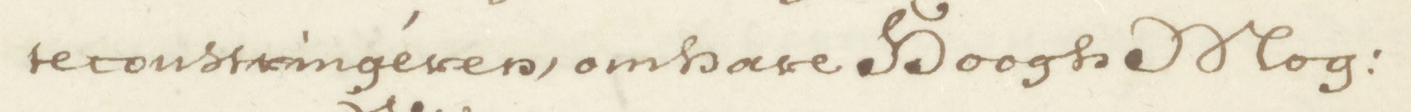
te constringeren, om hare Hoogh Mog:
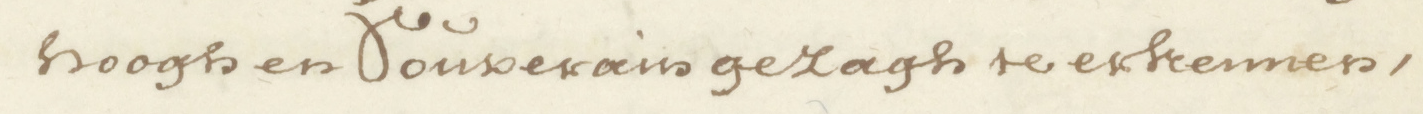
hoogh en Souverain gezagh te erkennen,
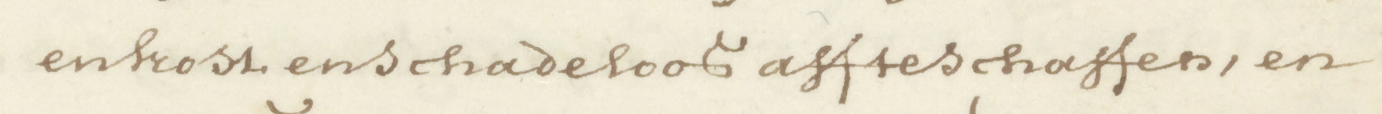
en kost en schadeloos aff te schaffen, en
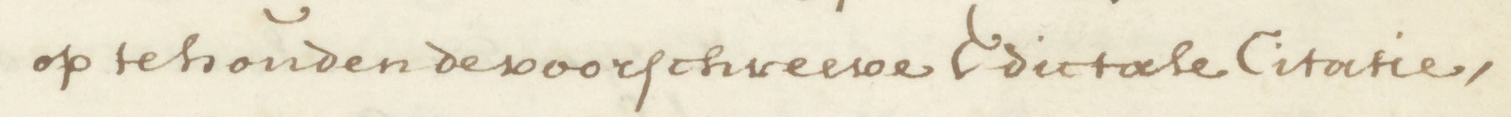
op te houden de voorschreeve Edictale Citatie,
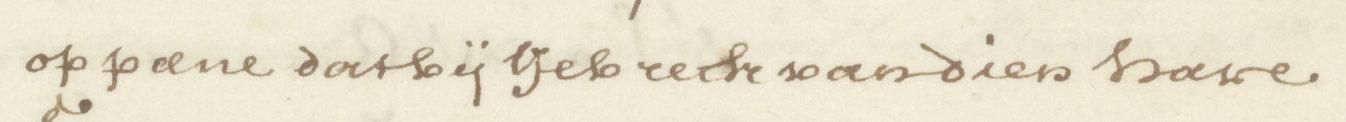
op peene dat bij gebreck van dien hare
